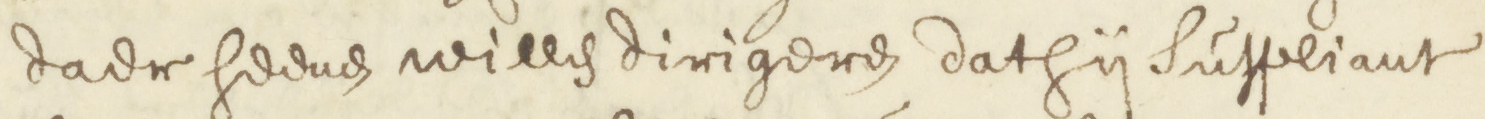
daer heenen willen dirigeren dat hij suppliant
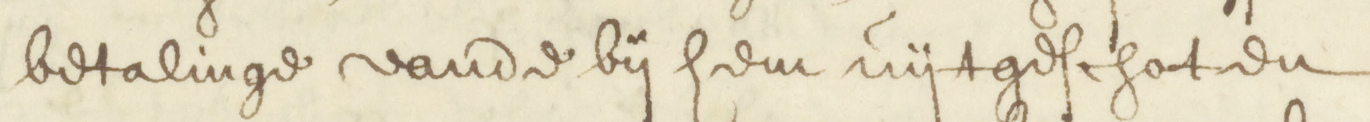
betalinge vande bij hem uijtgeschoten
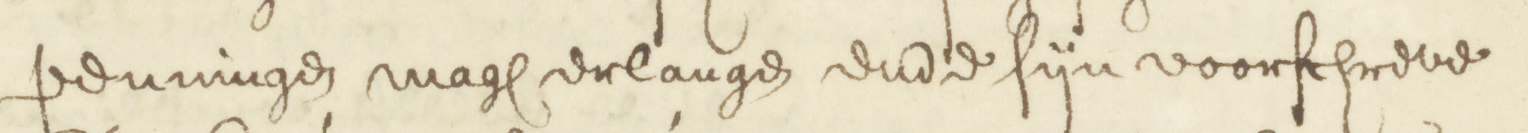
penningen magh erlangen ende sijn voorschreve
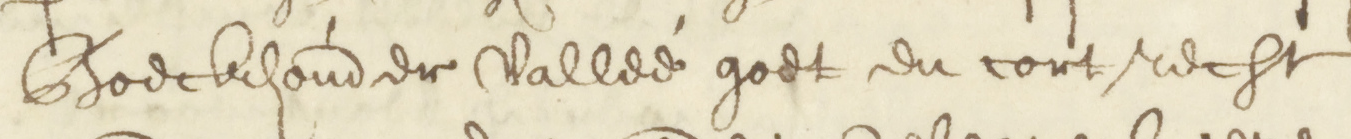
Boeckhouder Walleé goet en cort recht
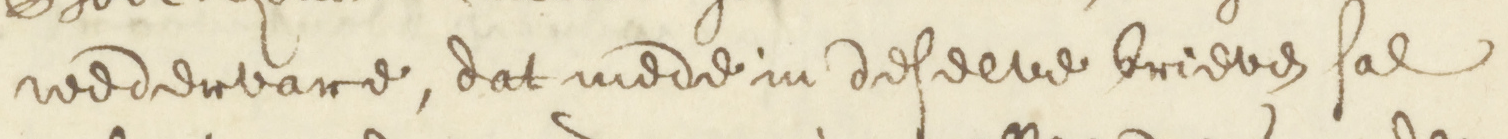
wedervare, dat mede in deselve brieven sal
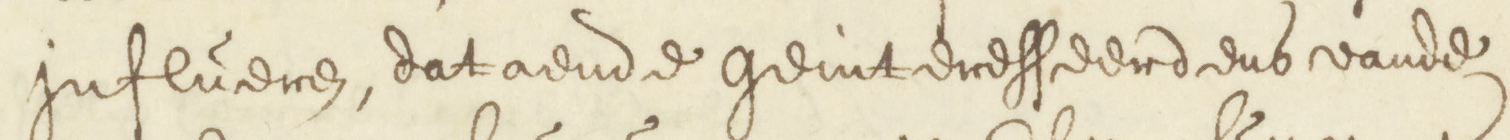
influeren, dat aende geinteresseerdens vande
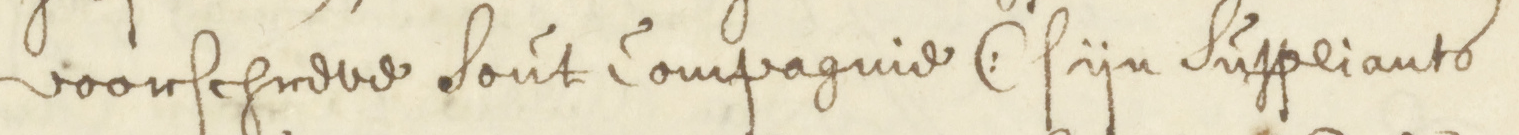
voorschreve sout Compagnie (:sijn suppliants
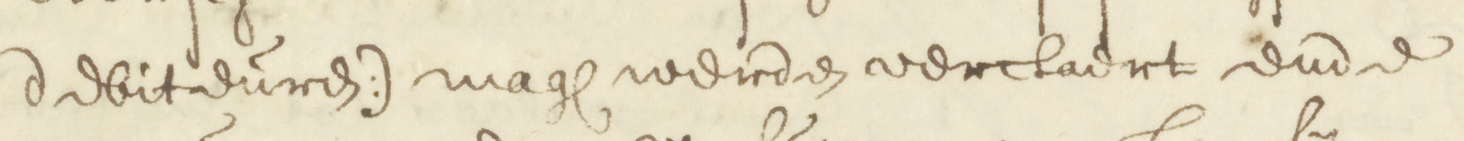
debiteuren:) magh werden verclaert ende
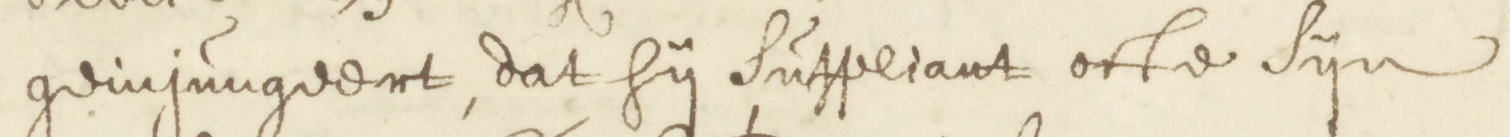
geinjungeert, dat hij suppliant ofte sijn
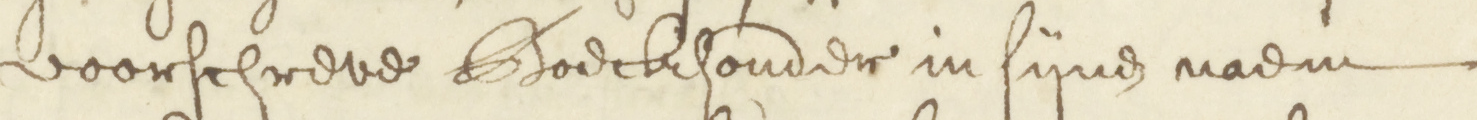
voorschreve Boeckhouder in sijnen naem
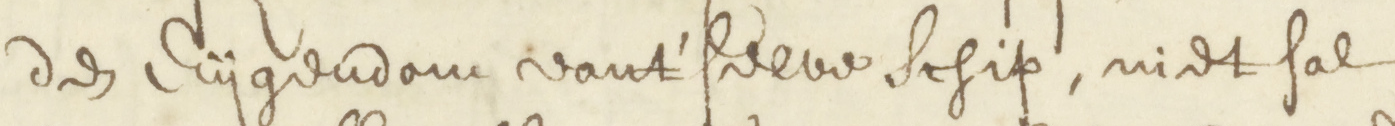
den Eijgendom vant' selve schip, niet sal
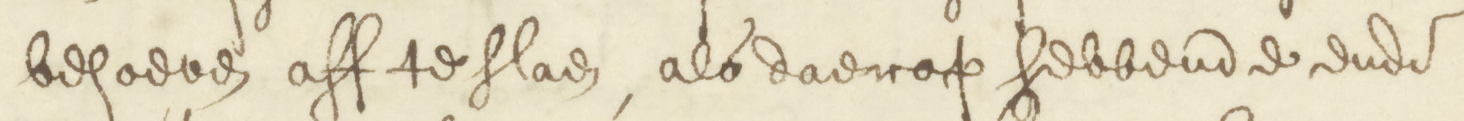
behoeven aft te slaen, als daerop hebbende ende
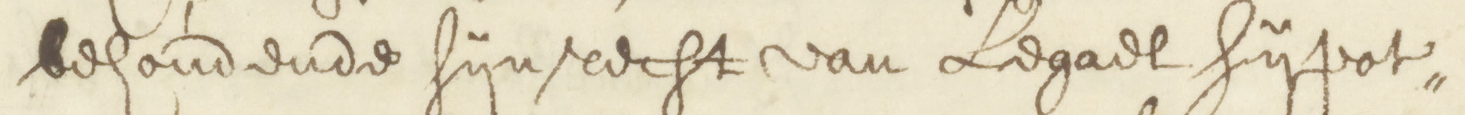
behoudende sijn recht van legael hijpot,,
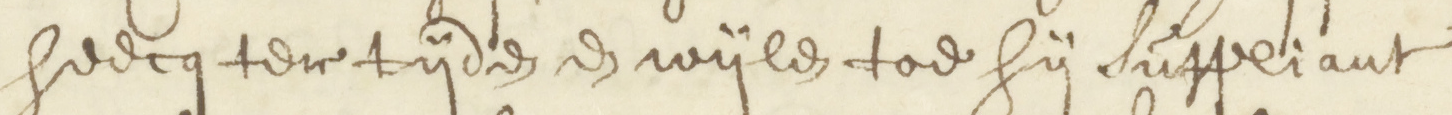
heecq ter tijden & wijlen toe sij suppliant
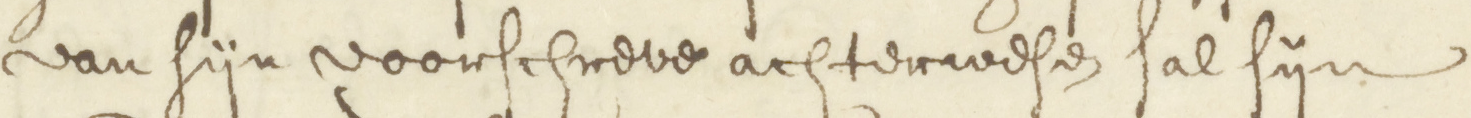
van sijn voorschreve achterwesen sal sijn
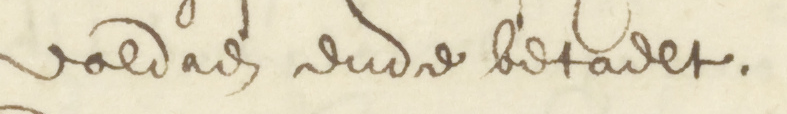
voldaen ende betaelt.
